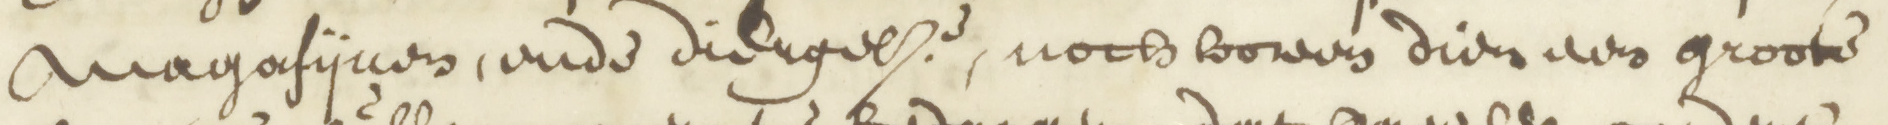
Magasijnen, ende diergele., noch boven dien een groote
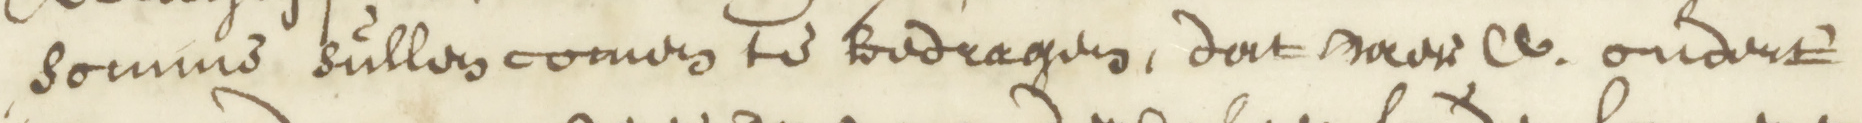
somme sullen comen te bedragen, dat haer E. ondert‛
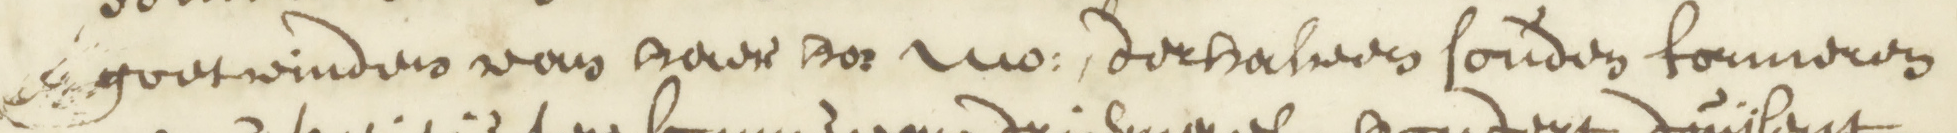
goetvinden van haer ho:Mo:, derhalven souden formeren
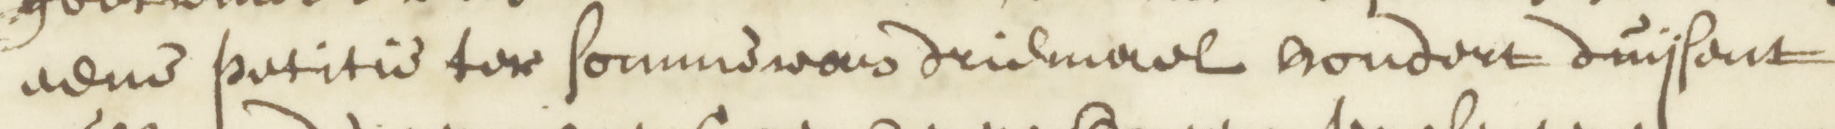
eene petitie ter somme van driemael hondert duijsent
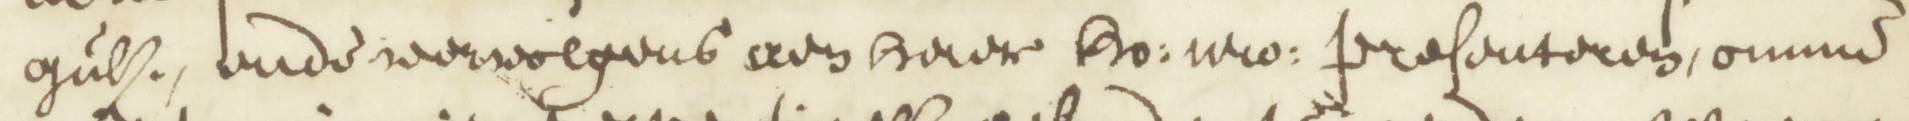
gul., ende vervolgens aen haer Ho:Mo: presenteren, omme
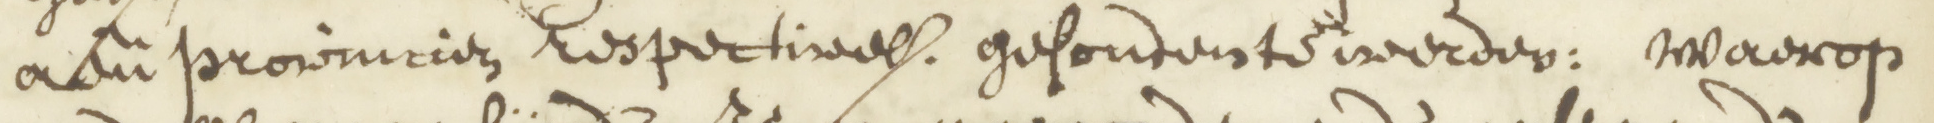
aen provincien respectivel. gesonden te werden: Waerop
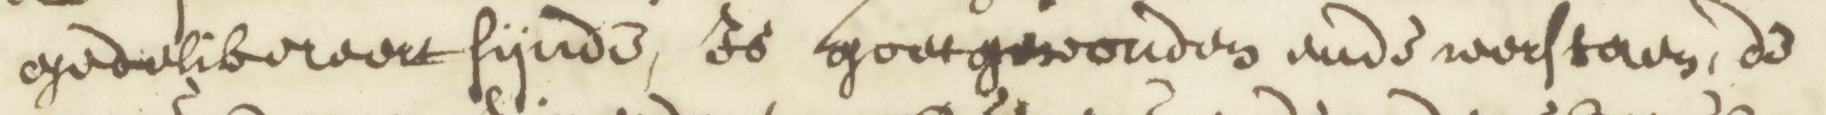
gedelibereert sijnde, Is goetgevonden ende verstaen, de
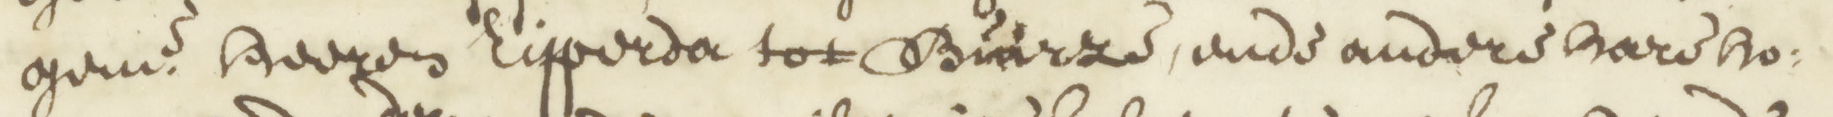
geme. Heeren Ripperda tot Buirze, ende andere hare ho:
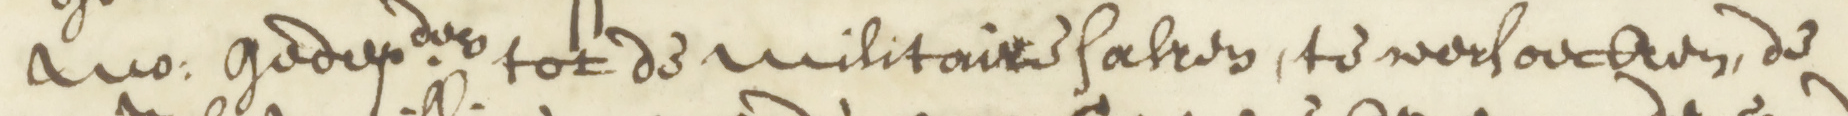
Mo: Gedepden. tot de Militaire saken, te versoecken, de
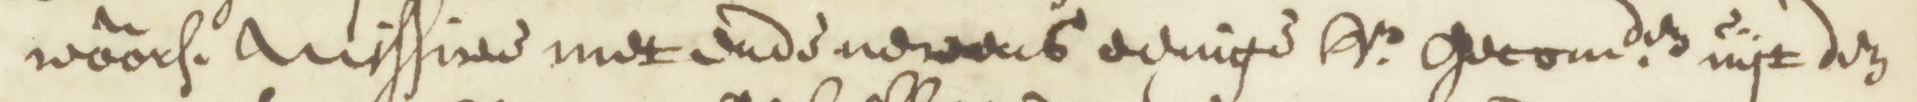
voors. Missive met ende nevens eenige Hn. Gecomden. uijt den
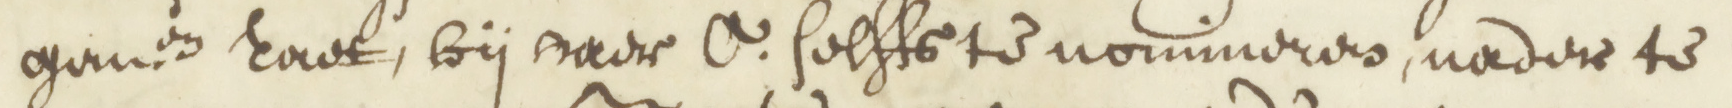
gemen. Raet, bij haer E. selffs te nomineren, nader te —
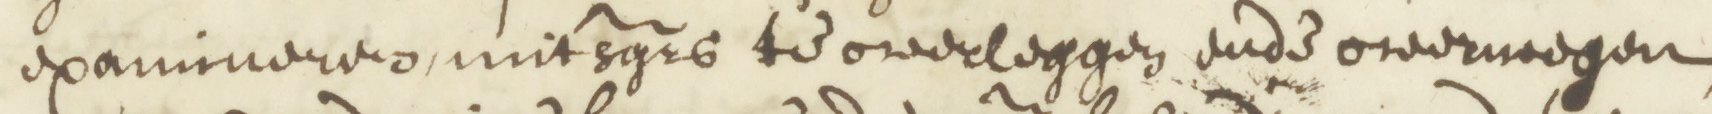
examineren, mitsgrs te overleggen ende overwegen
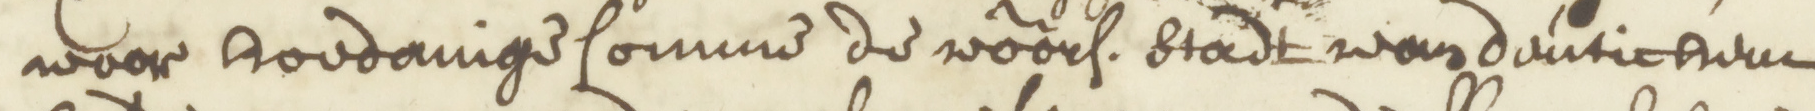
voor hoedanige somme de voors. Stadt van deutichem
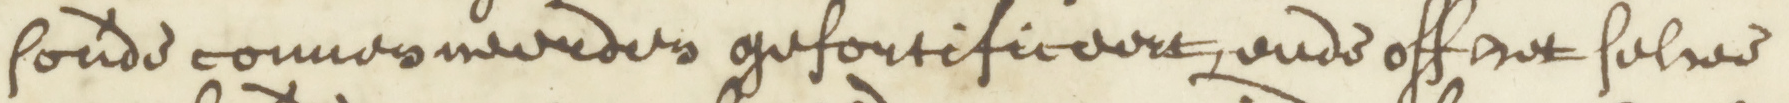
soude connen werden gefortificeert, ende off het selve
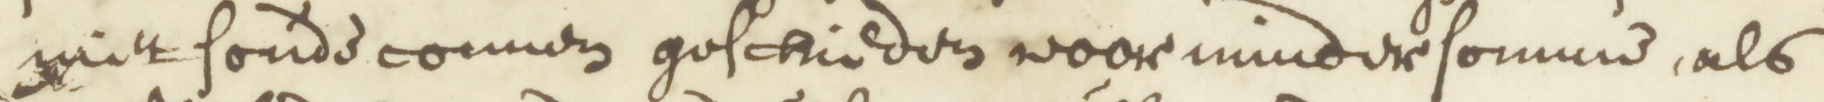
niet soude connen geschieden voor minder somme, als
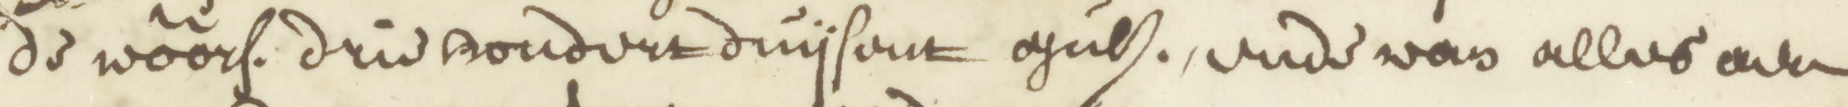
de voors. driehondert duijsent gul., ende van alles aen
